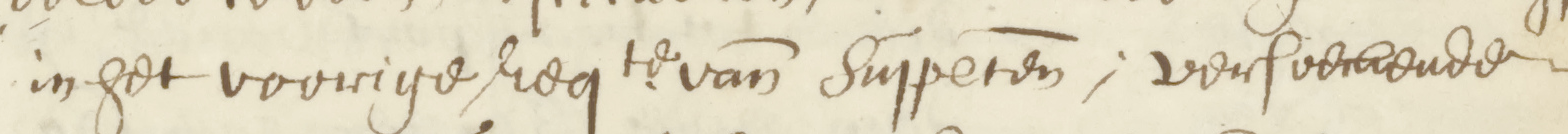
in het voorige reqte van Supplten; versoeckende
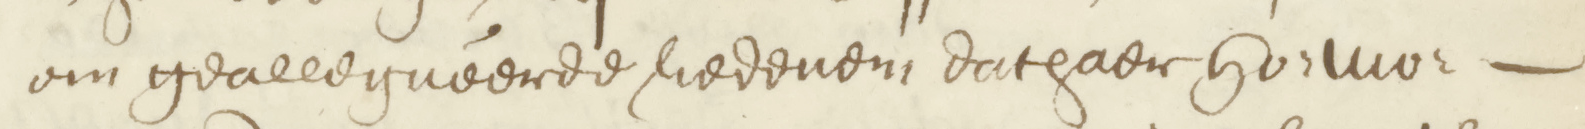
om geallegueerde redenen dat haer ho:mo:
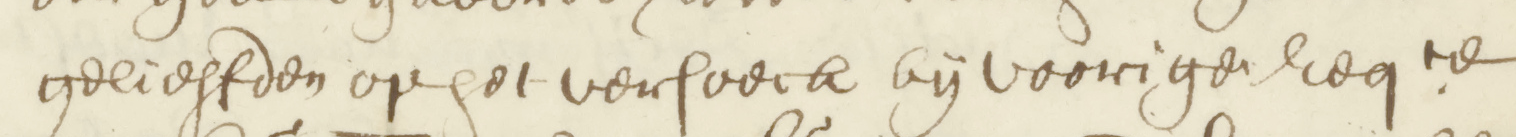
gelieffden op het versoeck bij voorige reqte
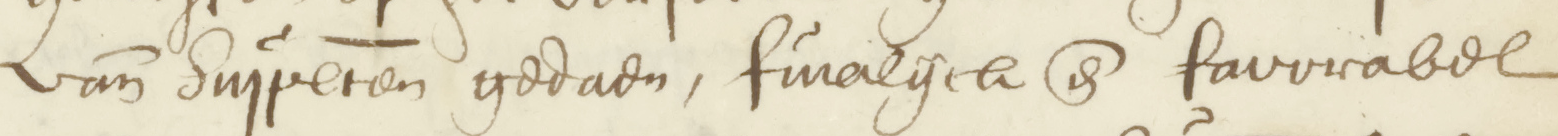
van Supplten gedaen, finalijck en favorabel
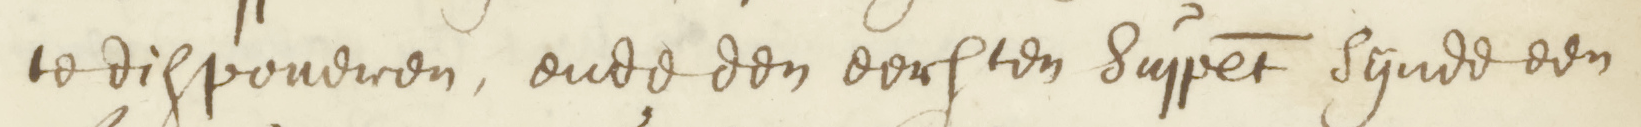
te disponeren, ende den eersten Supplt Sijnde een
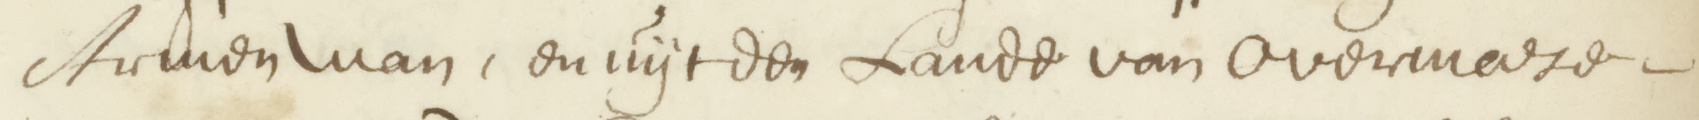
Armen man, en uijt den Lande van Overmaze
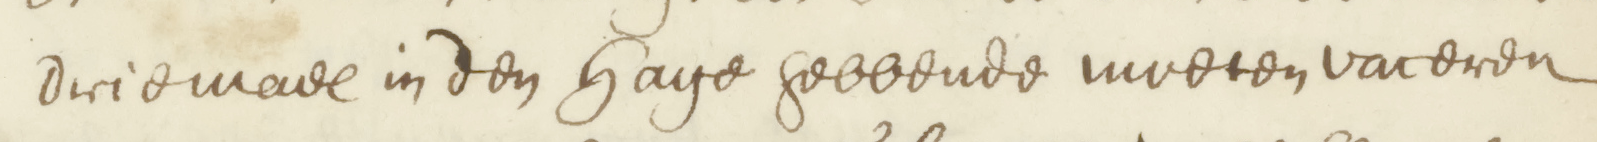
driemael in den hage hebbende moeten vaceren
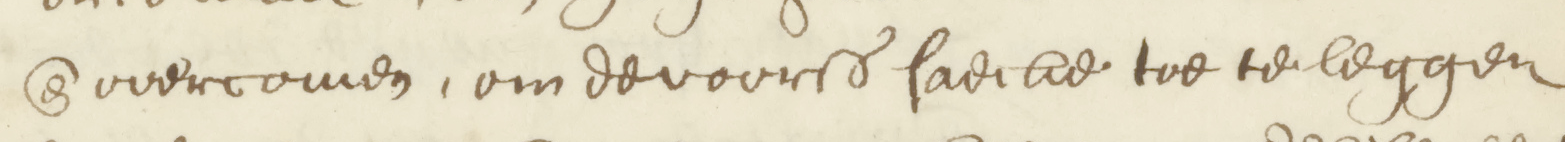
& overcomen, om de voors. saecke toe te leggen
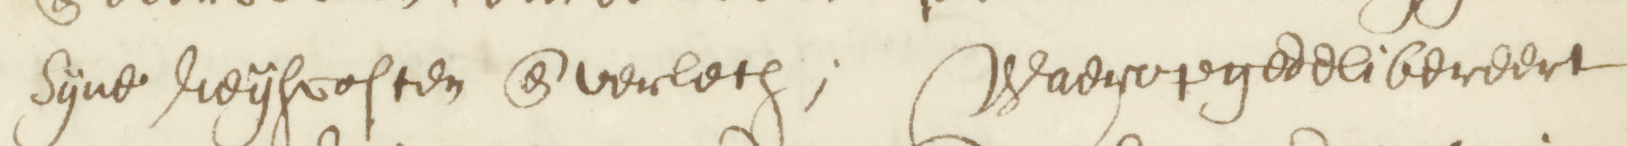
sijne reijscosten & verleth: Waerop gedelibereert
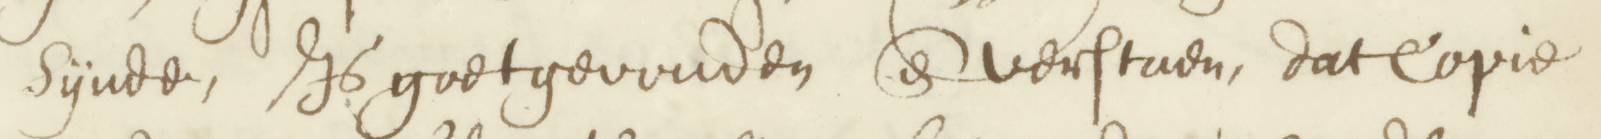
Sijnde, Is goetgevonden & verstaen, dat Copie
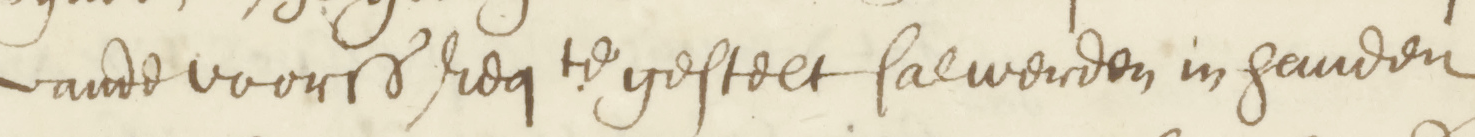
vande voors. reqte gestelt sal werden in handen
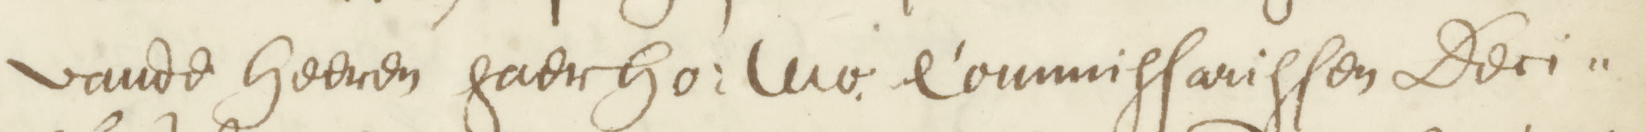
vande heeren haer ho:mo: Commissarissen Deci„
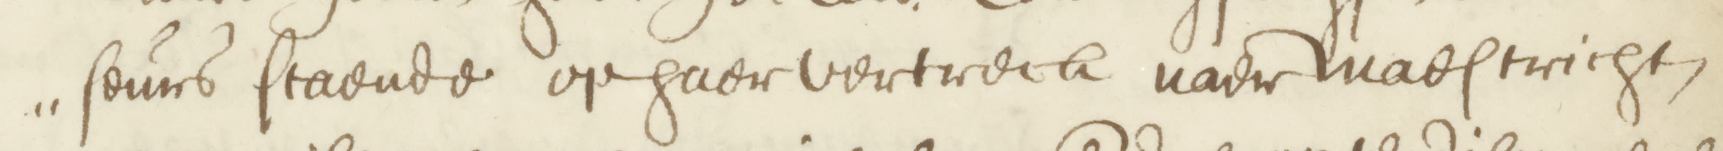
seurs staende op haer vertreck naer maestricht,
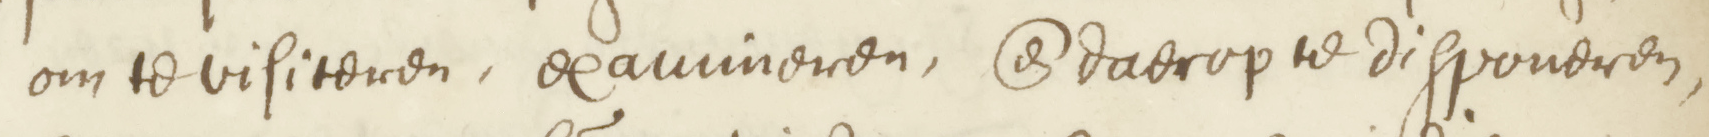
om te visiteren, examineren, & daerop disponeren,
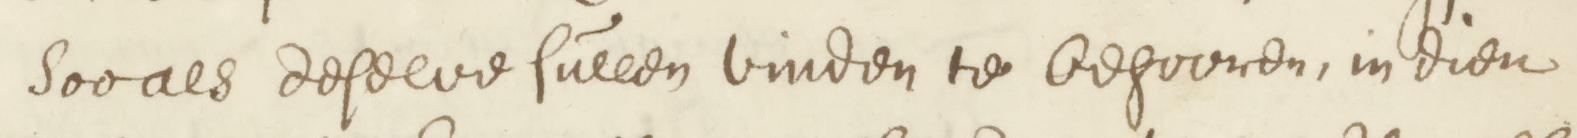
soo als deselve sullen vinden te behooren, in dien
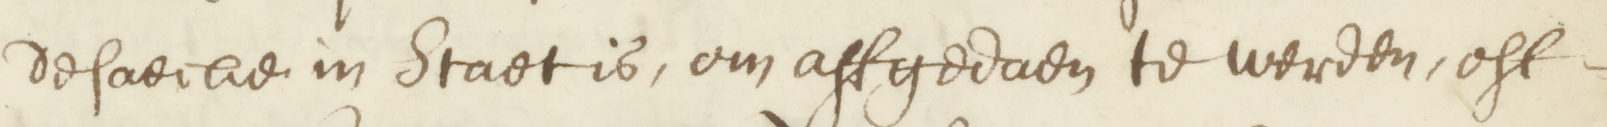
de saecke in Staet is, om affgedaen te werden, oft
